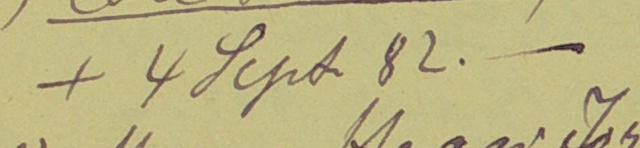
alt + am 4 Sept. 82
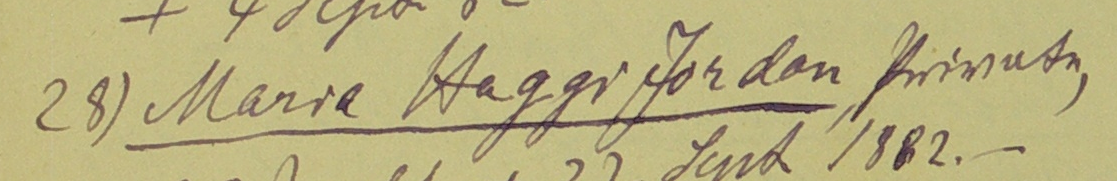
28.) Maria Haggi Jordan, Privatier,
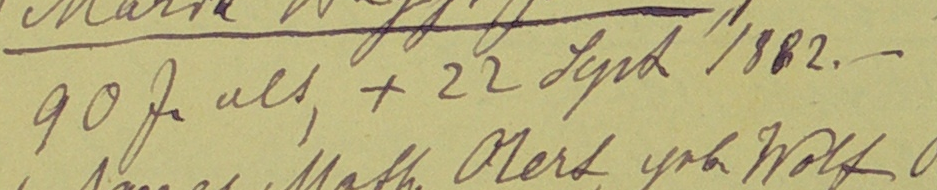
90 J. alt, + am 22 Sept. 82
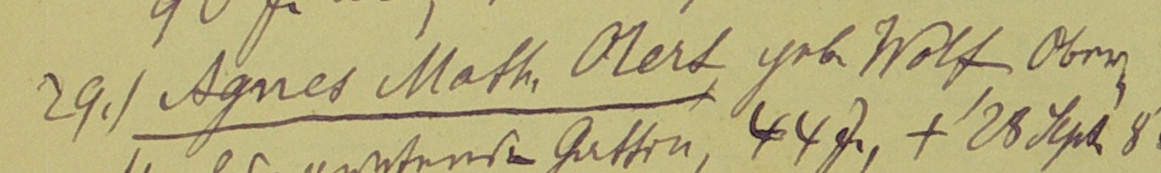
29.) Agnes Math. Olert, geb. Wolf, Ober-
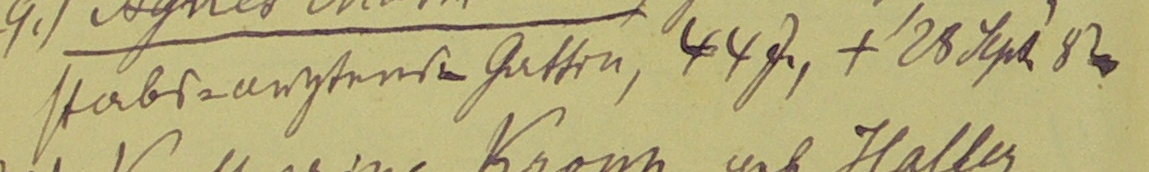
stabs-ß.. Gattin, 44 J. alt + am 28 Septem. 82
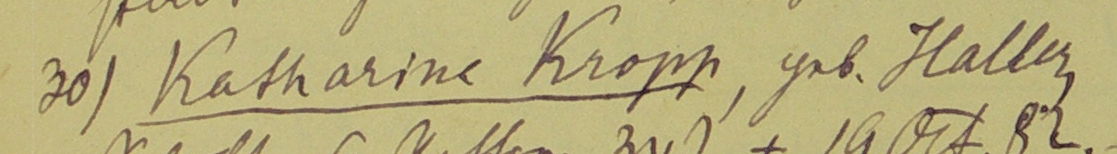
30.) Katherina Kropp, geb. Haller,
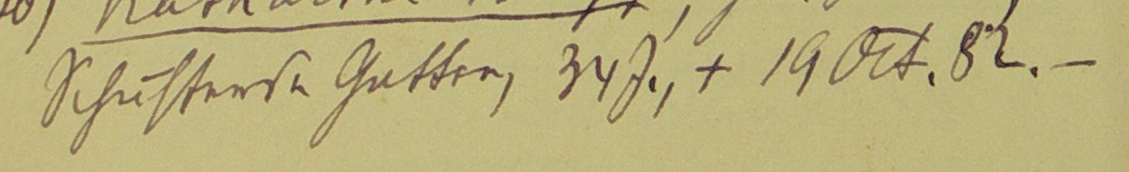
Schusters Gattin 34 J.19. Oct. 82
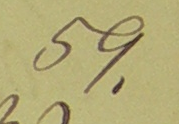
59
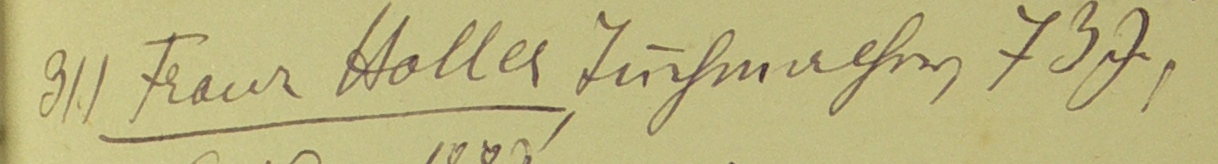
31.) Franz Stoller, Tuchmacher, 73 J. alt
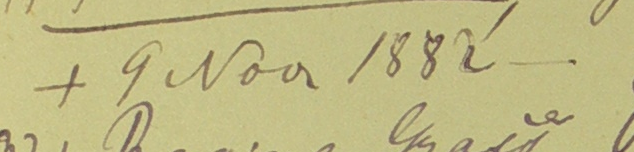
am 9 Nov. 82
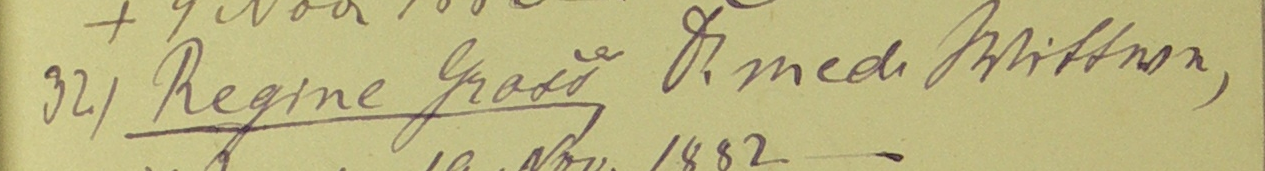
32.) Regine Grosser, Dr. med. Witwe
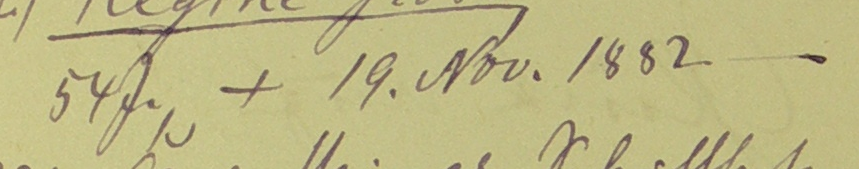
54 J. am 19 Nov. 82
